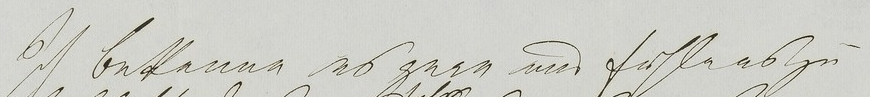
Ich bekenne es gern und fühle es zu
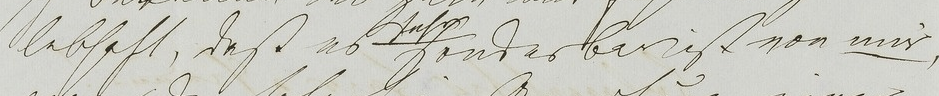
lebhaft, daß es sehr sonderbar ist von mir,
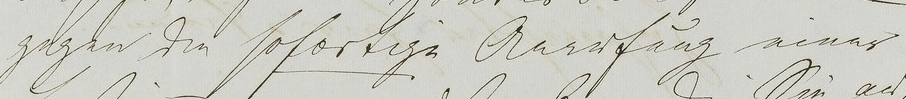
gegen die sofortige Anrufung einer
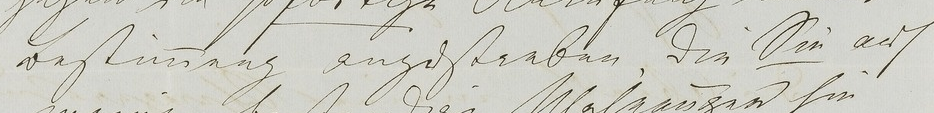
Bestimmung anzustreben, die Sie auf
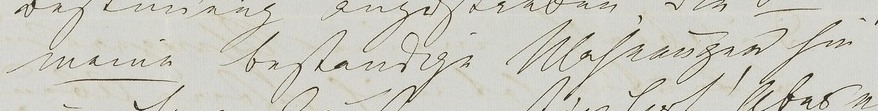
meine beständige Mahnungen hin
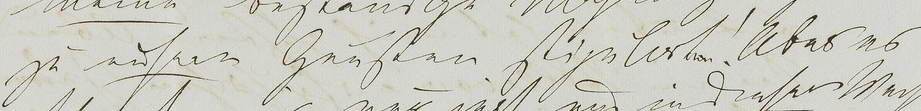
zu unsern Gunsten stipulirten! Aber es
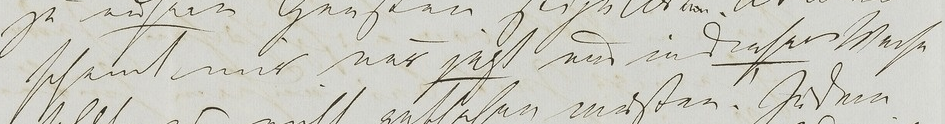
scheint mir nur jezt und in dieser Weise
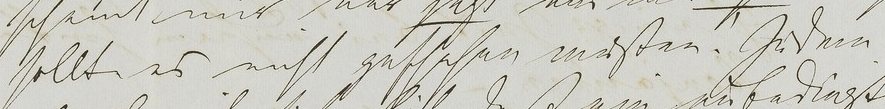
sollte es nicht geschehen müßen! Zudem
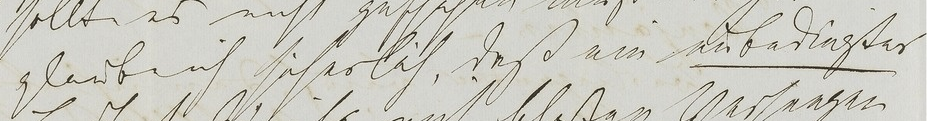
glaube ich sicherlich, daß ein unbedingter
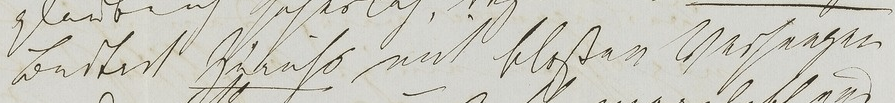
Beitrit Zürichs mit bloßen Weisungen
